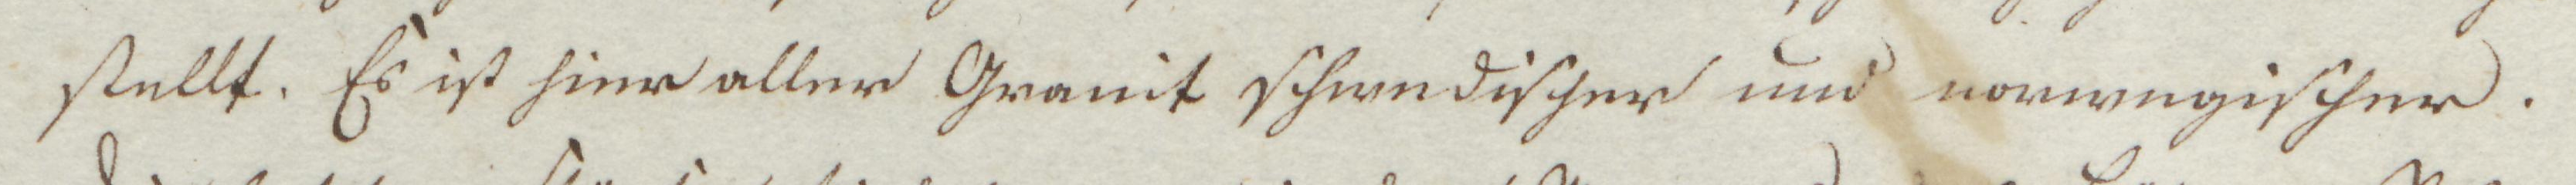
stellt. Es ist hier aller Granit schwedischer und norwegischer.
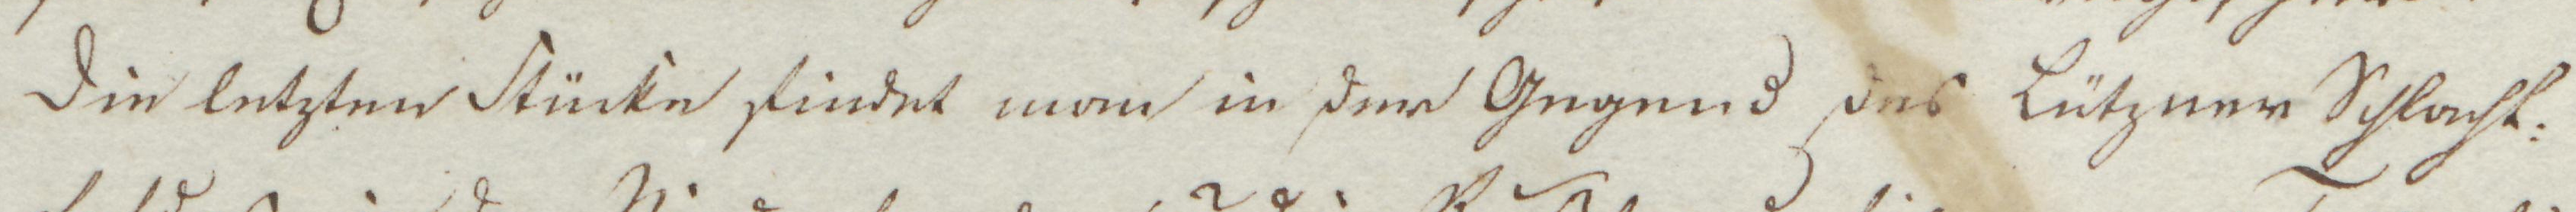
Die letzten Stücke findet man in der Gegend des Lützner Schlacht-
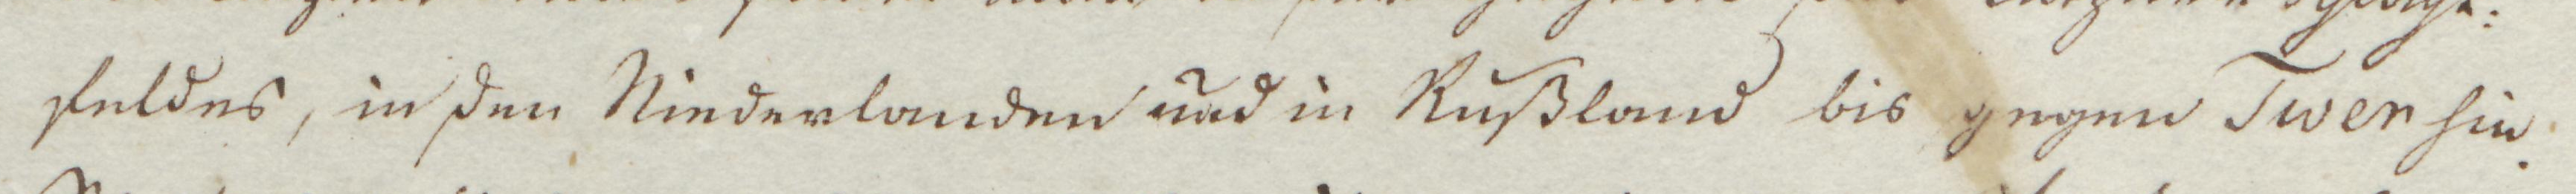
feldes, in den Niederlanden u.und in Rußland bis gegen Twen hin.
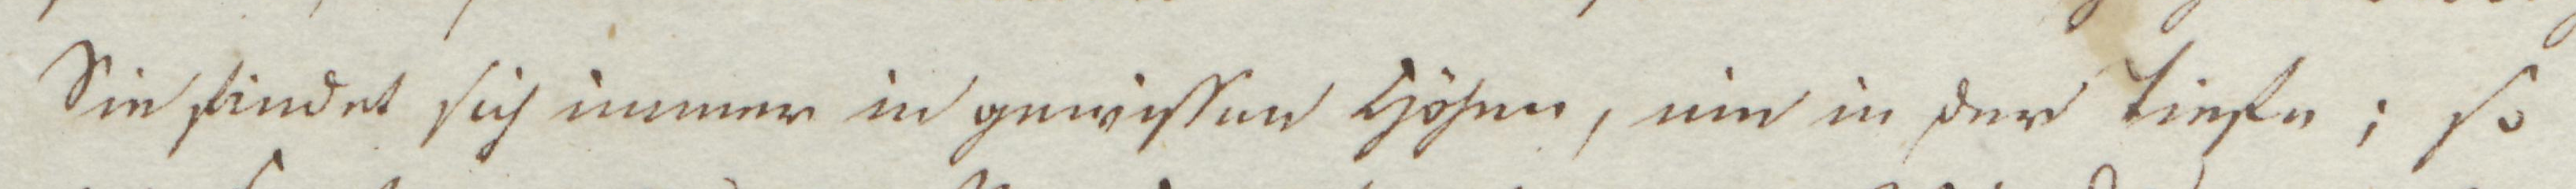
Sie findet sich immer in gewissen Höhen, nie in der Tiefe; so
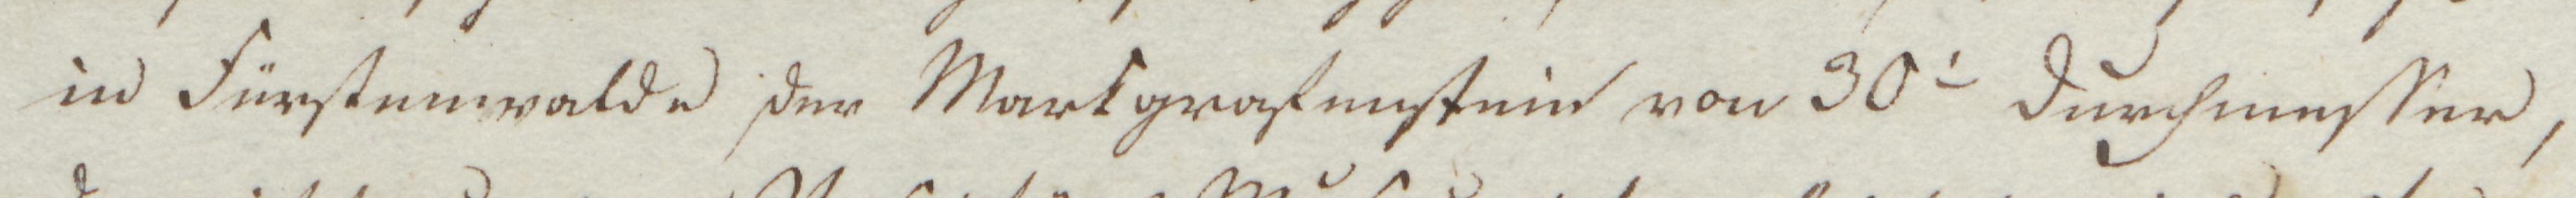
in Fürstenwalde der Markgrafenstein von 30′ Durchmesser,
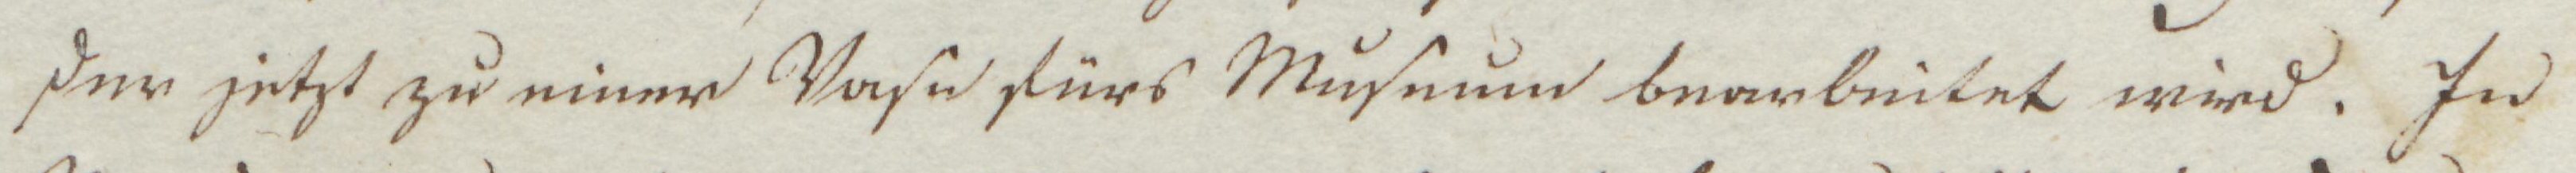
der jetzt zu einer Vase fürs Museum bearbeitet wird. In
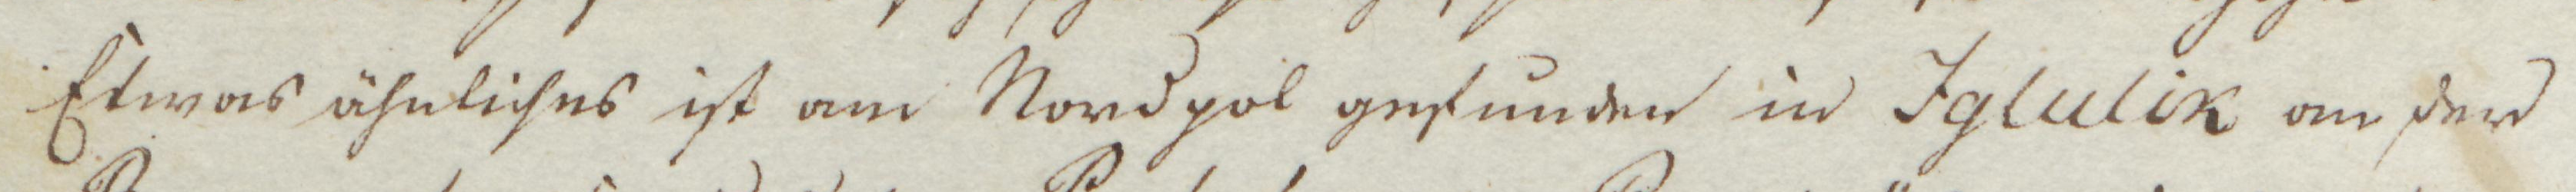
Etwas ähnliches ist am Nordpol gefunden in Igulik an der
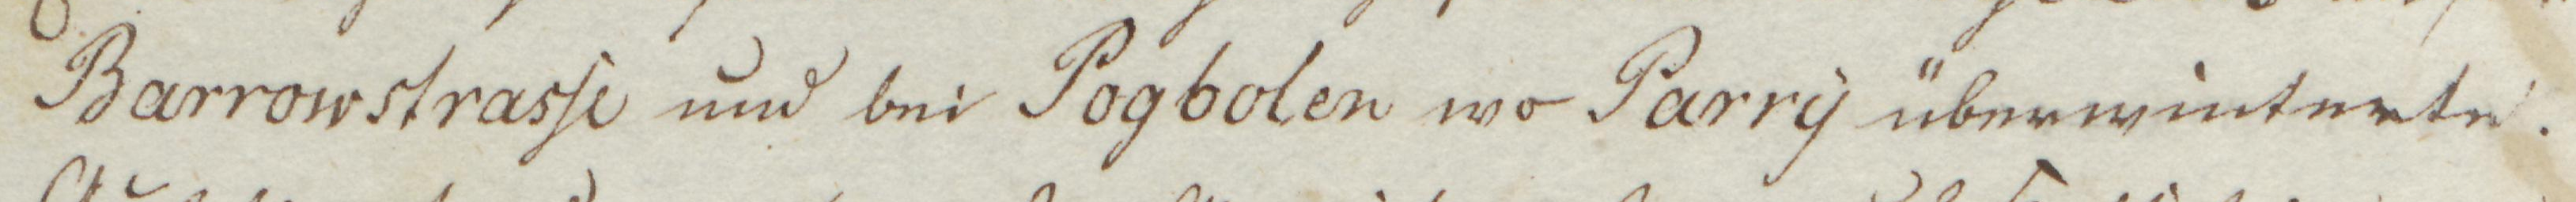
Barrowstrasse und bei Pogbolen wo Parrÿ überwinterte.
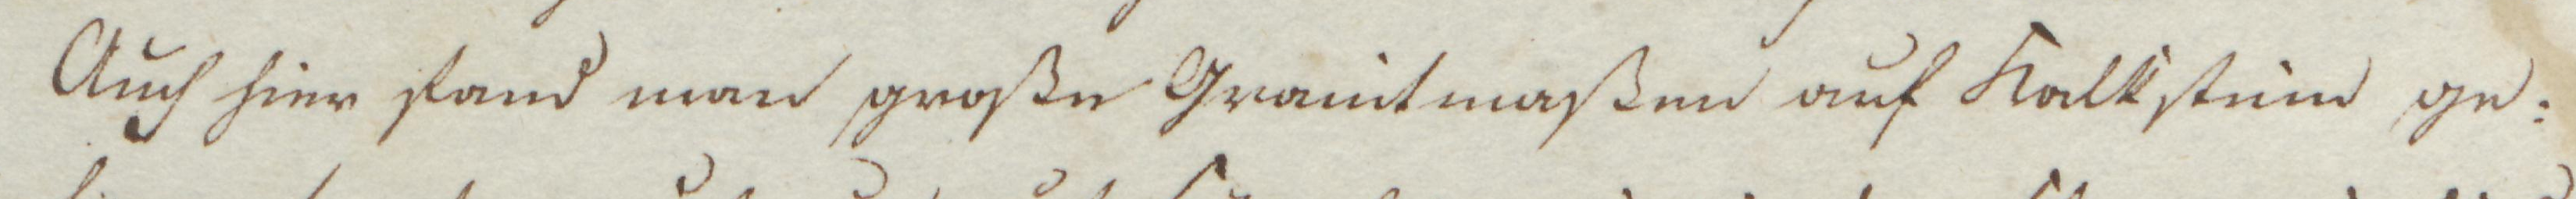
Auch hier fand man große Granitmaßen auf Kalkstein ge-
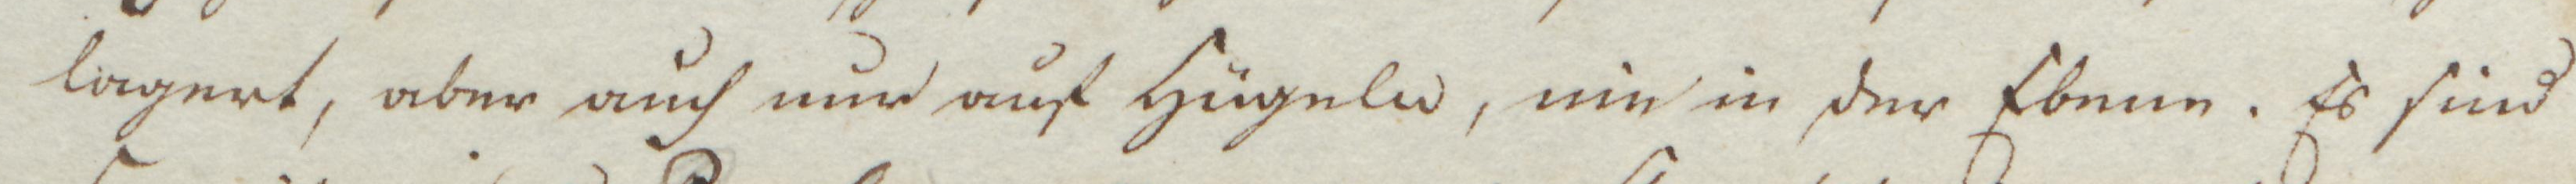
lagert, aber auch nur auf Hügeln, nie in der Ebene. Es sind
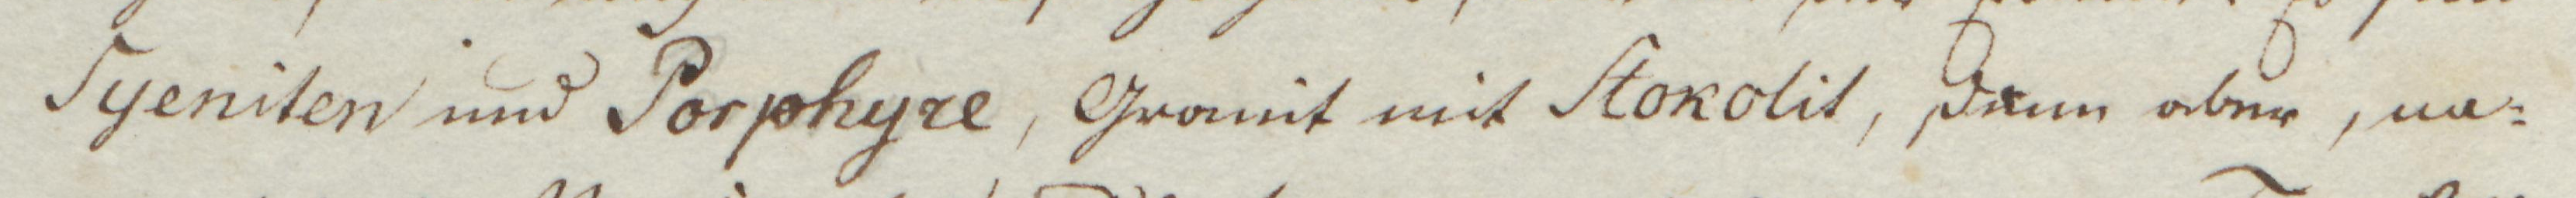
Syeniten und Porphyre, Granit mit Stokolit, deann aber, na-
